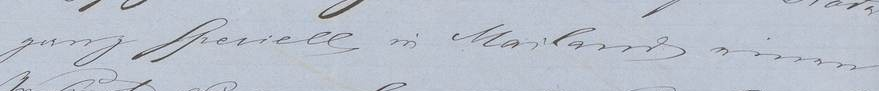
ganz speciell, in Mailand einen
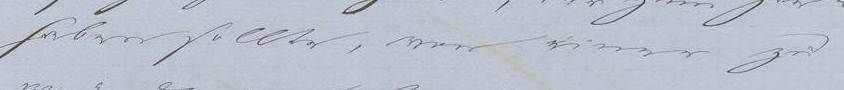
haben sollte, von einer zu
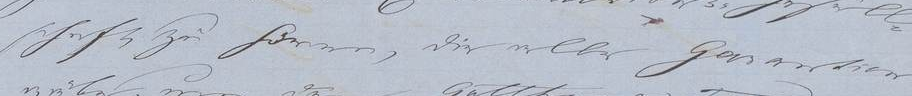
schaft zu hören, die alle Garantien
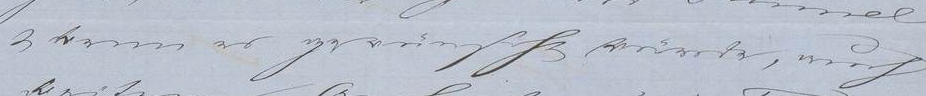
& wenn es gewünscht würde, auch
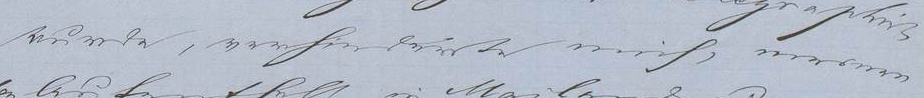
wurde, verhinderte mich, meinen
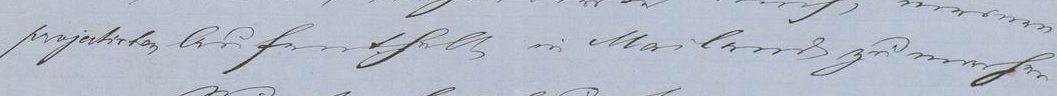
projectirten Aufenthalt in Mailand zu machen.
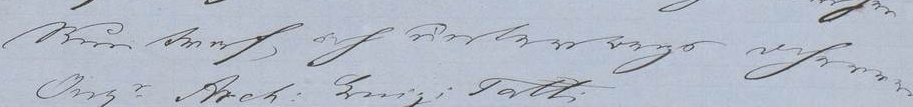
Nun traf ich unterwegs die Herren
